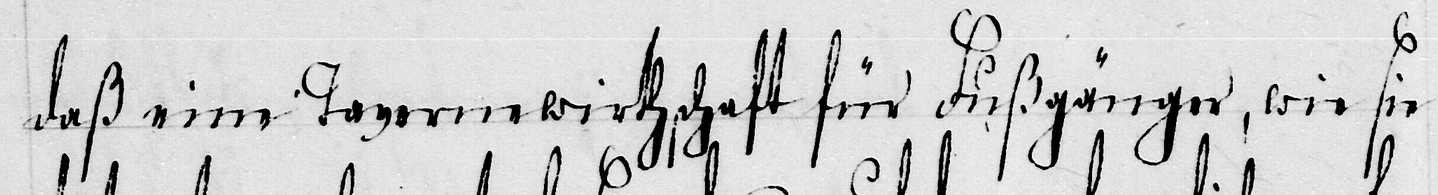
daß eine Tavernewirthschaft für Fußgänger, wie sie
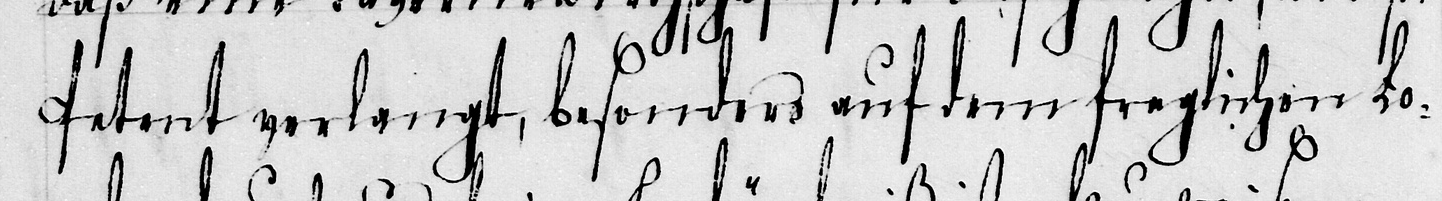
Petent verlangt, besonders auf dem fraglichen Lo¬
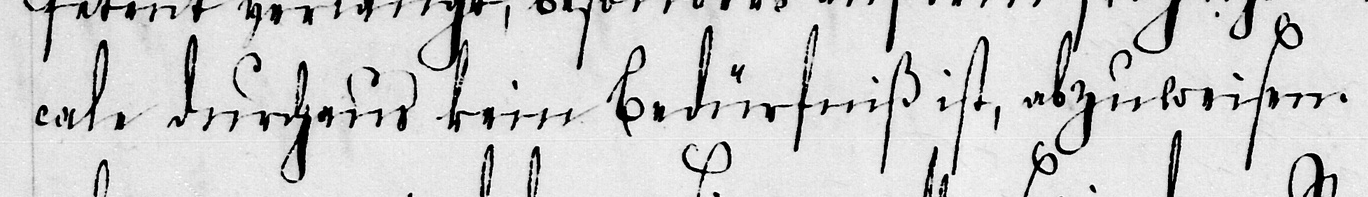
cale durchaus kein Bedürfniß ist, abzuweisen.
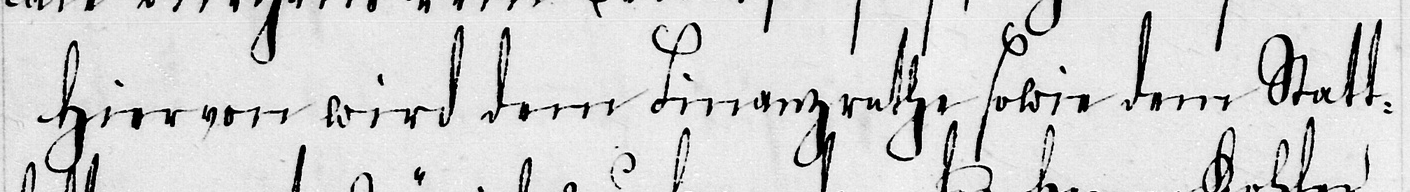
Hiervon wird dem Finanzrathe sowie dem Statt¬
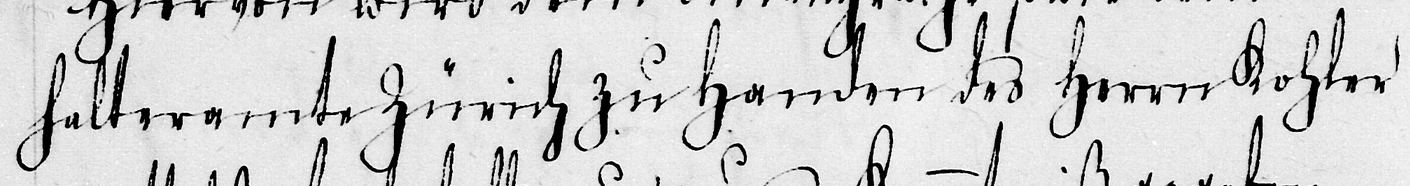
halteramte Zürich zu Handen des Herrn Kohler
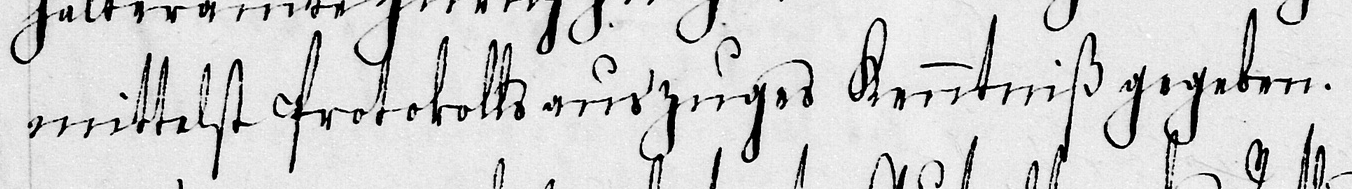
mittelst Protokollsauszuges Kenntniß gegeben.
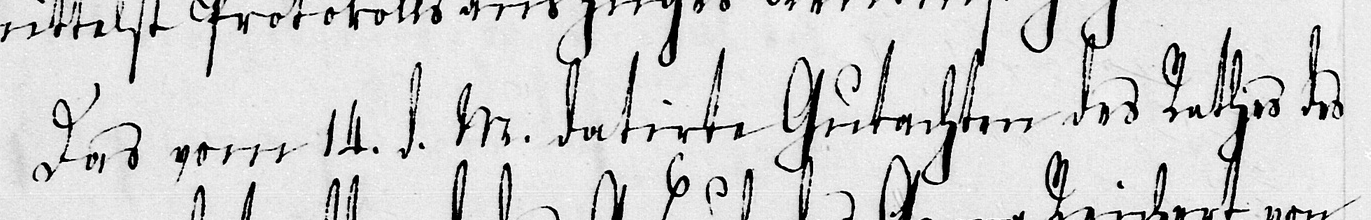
Das vom 14. d. M. datirte Gutachten des Rathes des
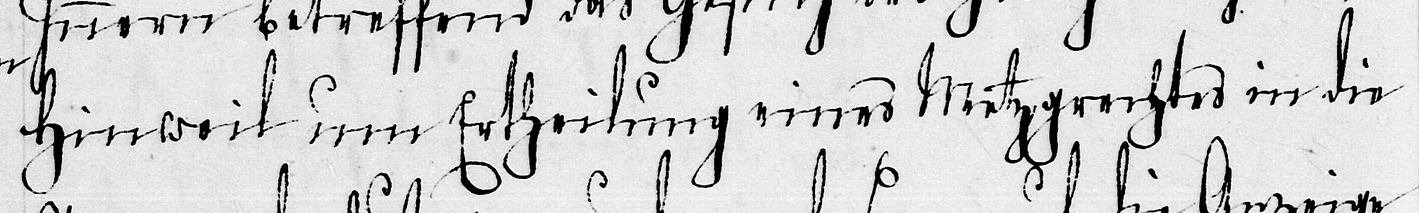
Hinweil um Ertheilung eines Metzgrechtes in die
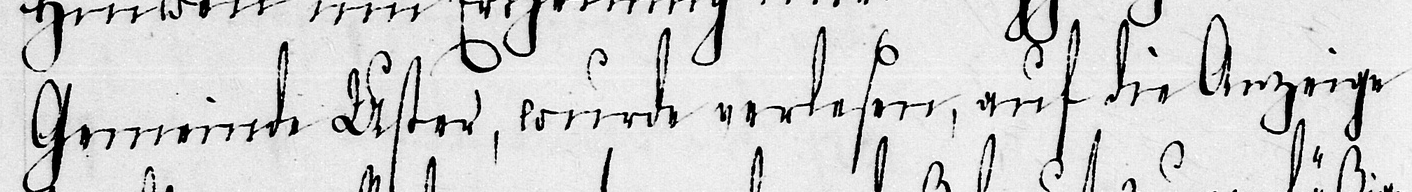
Gemeinde Uster, wurde verlesen, auf die Anzeige
